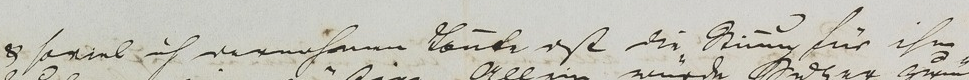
& soviel ich vernehmen konnte ist die Stimmung für ihn
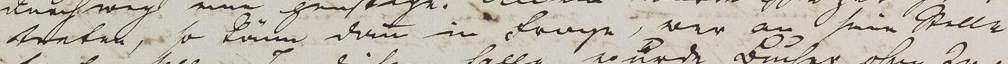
treten, so käme dann in Frage, wer an seine Stelle
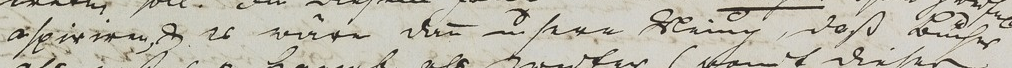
aspiriren, & es wäre dann unsere Meinung, daß Bucher
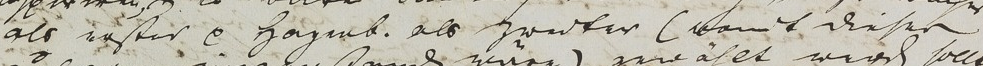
als erster & Hagenb. als zweiter (womit dieser
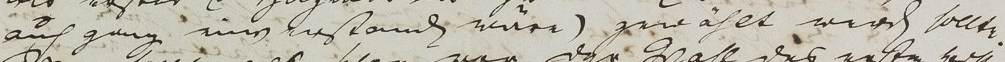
auch ganz einverstanden wäre) gewählt werden sollte.
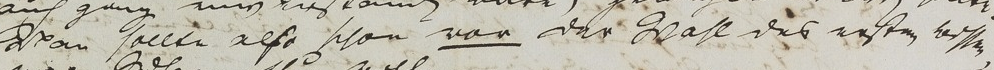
Man sollte also schon vor der Wahl des erstern wissen,
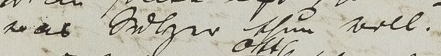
was Sulzer thun will. –
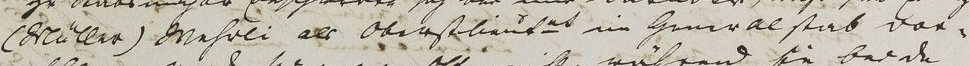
(Müller) Wehrli als Oberstlieutnt im Generalstab vor-
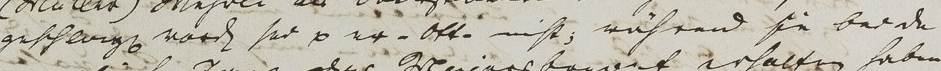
geschlagen worden sei & er – Ott – nicht; während sie beide
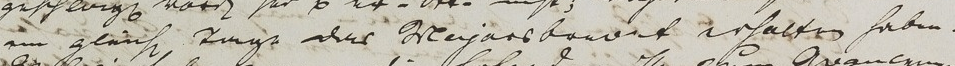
am gleichen Tage das Majorsbrevet erhalten haben.
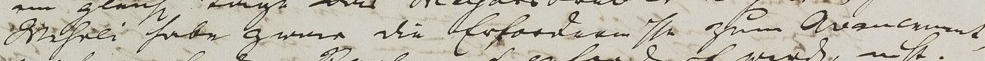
Wehrli habe zwar die Erfordernisse zum Avancement,
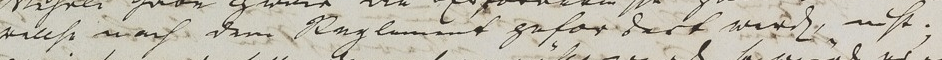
welche nach dem Reglement gefordert werden, nicht;
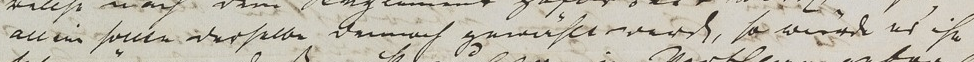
allein sollte derselbe dennoch gewählt werden, so würde es ihn
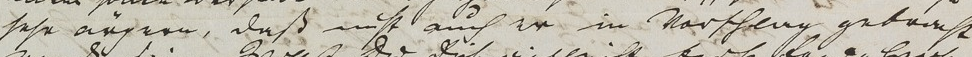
sehr ärgern, daß nicht auch er in Vorschlag gebracht
